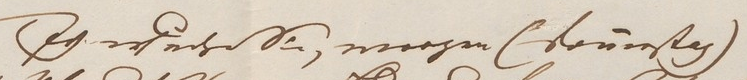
Ich ersuche Sie, morgen (Donnerstag)
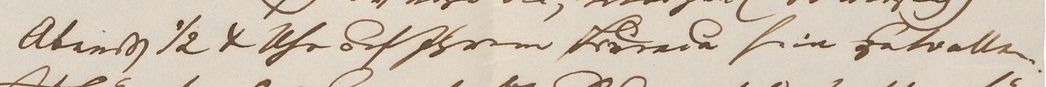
Abends ½ 4 Uhr auf Ihrem Bureau sein zu wollen.
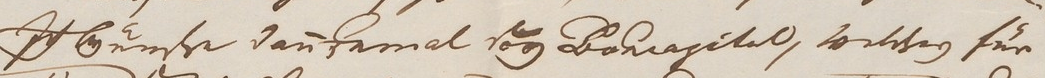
Ich wünsche dannzumal das Baucapital, welches für
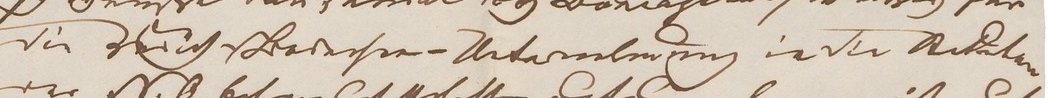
die Zürich–Bodensee-Unternehmung in die Statuten
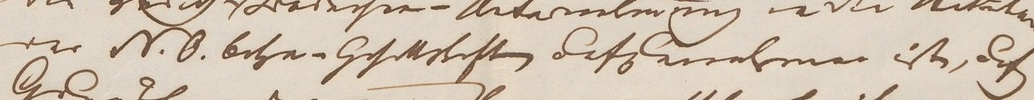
der N. O. Bahn-Gesellschaft aufzunehmen ist, auf
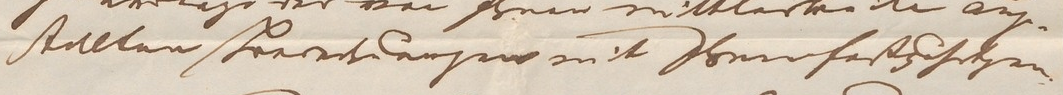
stellten Berechnungen mit Ihnen festzusetzen.
